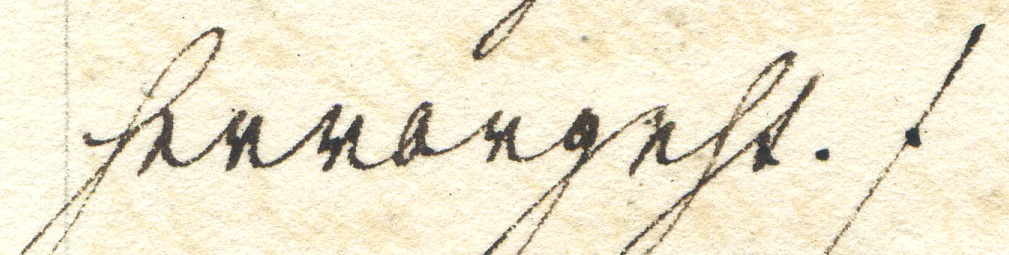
hervorgeht.)
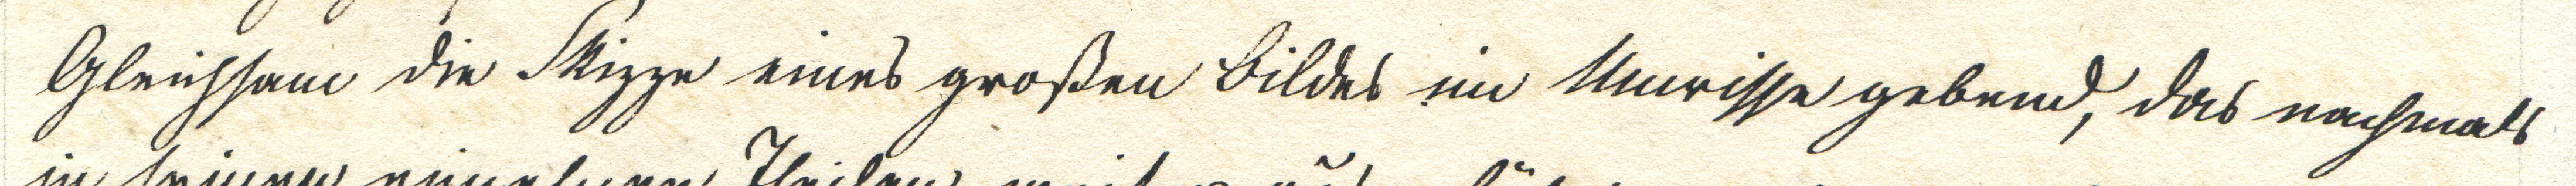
Gleichsam die Skizze eines großen Bildes im Umrisse gebend, das nachmals
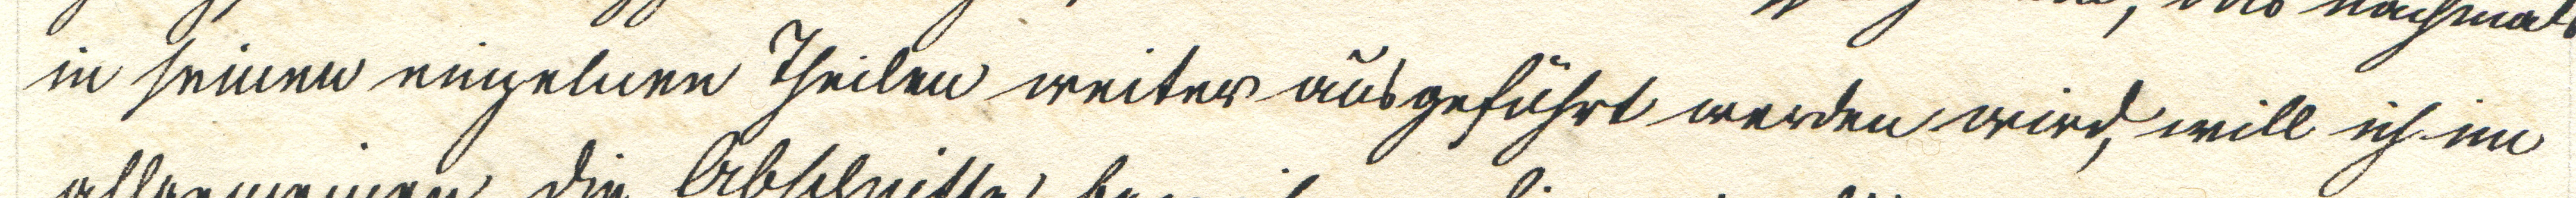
in seinen einzelnen Theilen weiter ausgeführt werden wird, will ich im
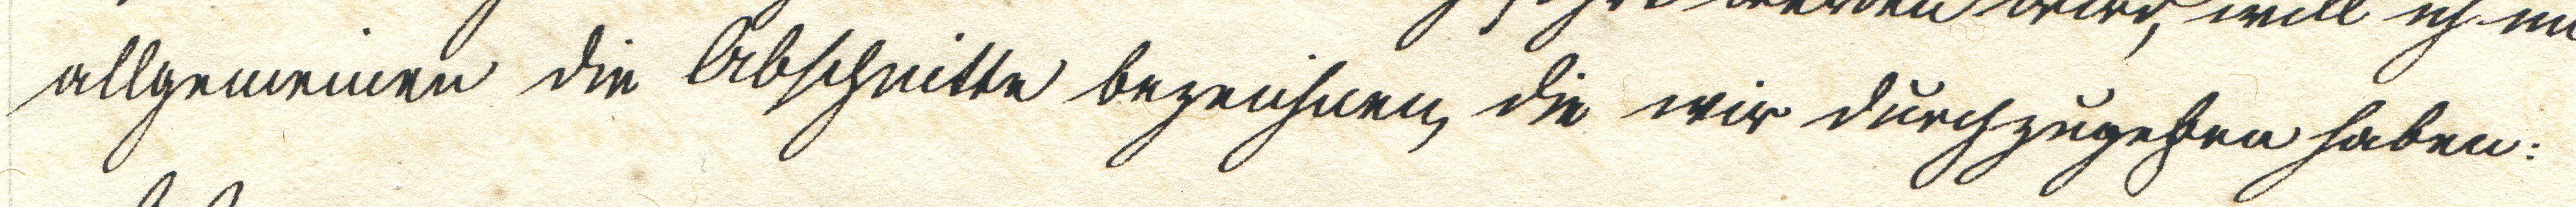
allgemeinen die Abschnitte bezeichnen, die wir durchzugehen haben:
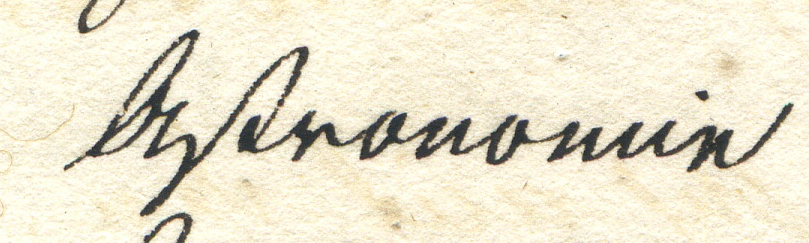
Astronomie
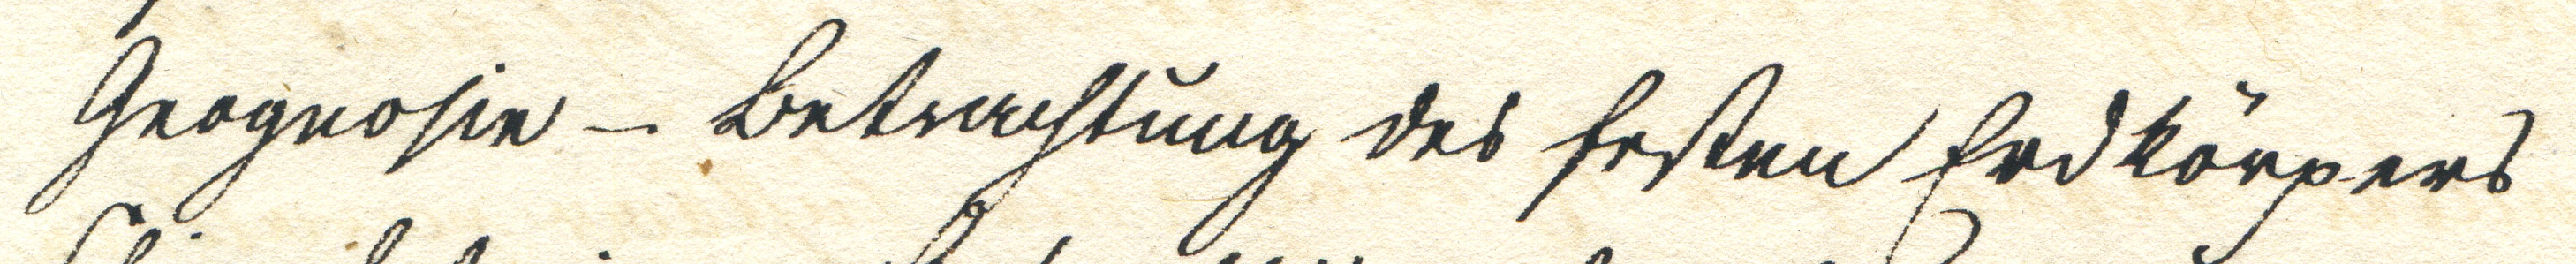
Geognosie - Betrachtung des festen Erdkörpers
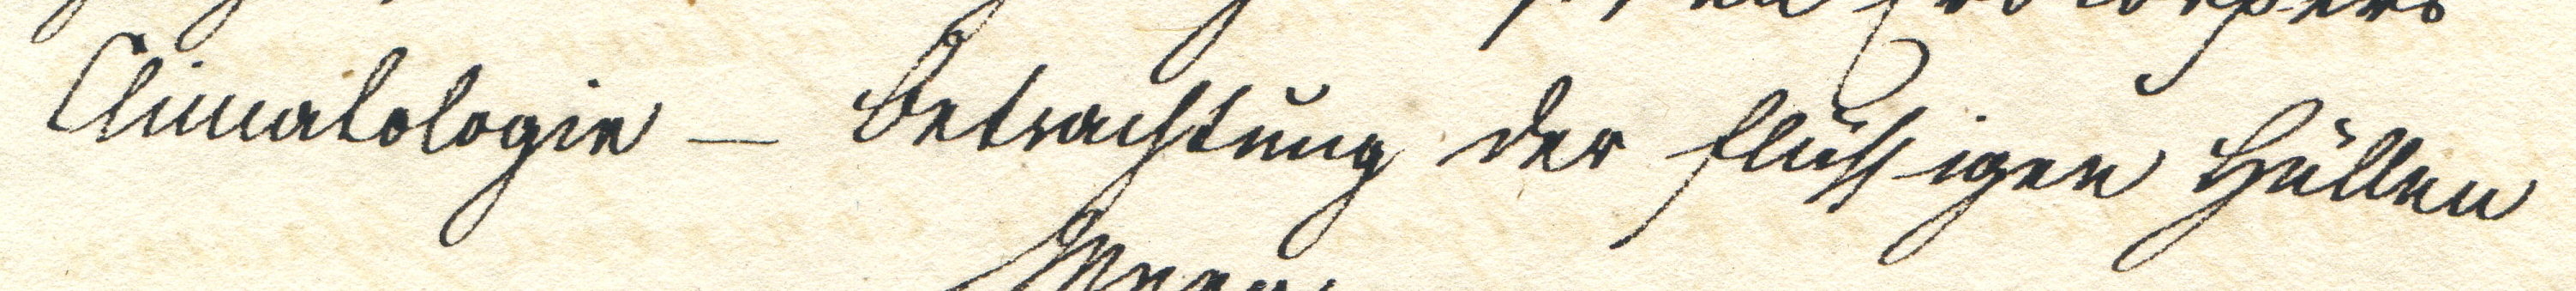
Climatologie - Betrachtung der flüssigen Hüllen
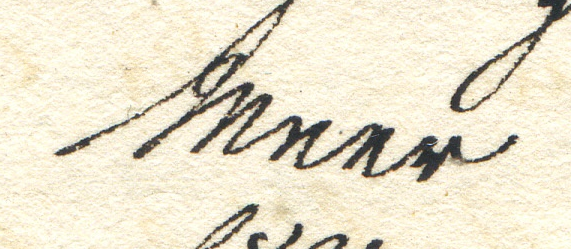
Meer
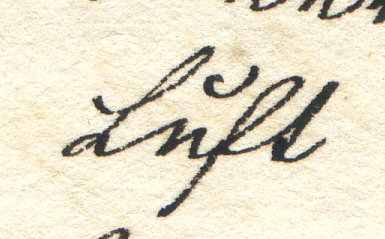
Luft
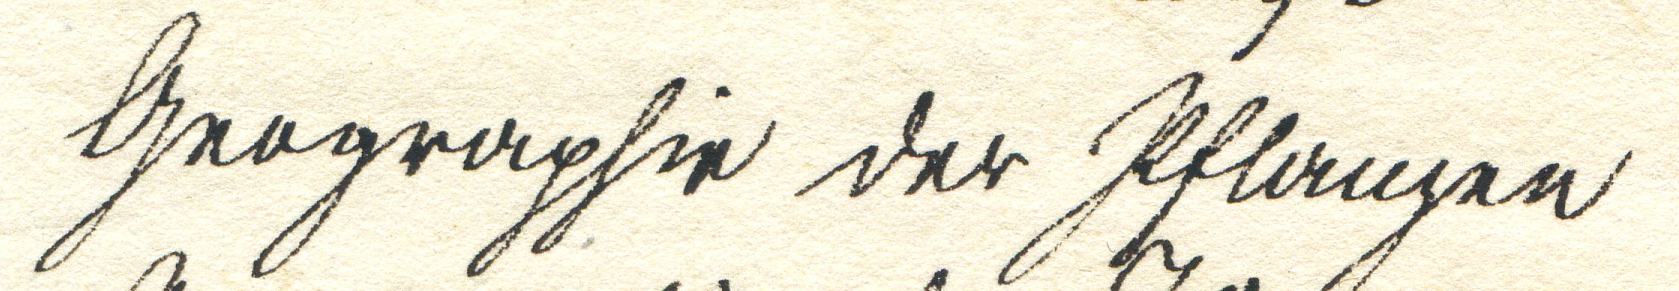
Geographie der Pflanzen
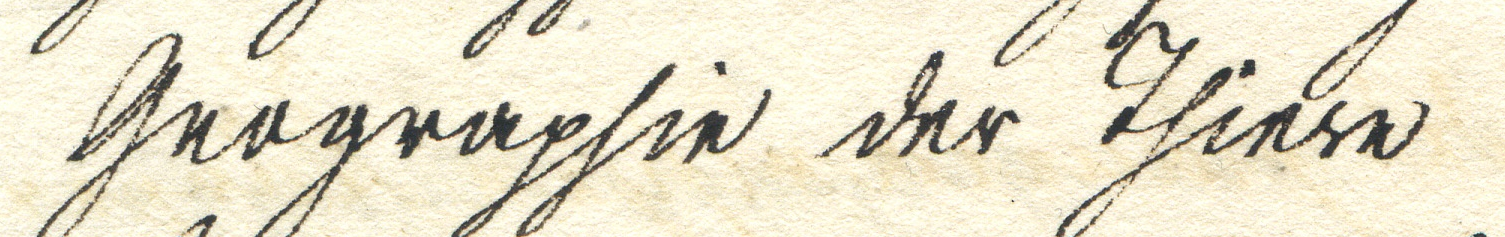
Geographie der Thiere
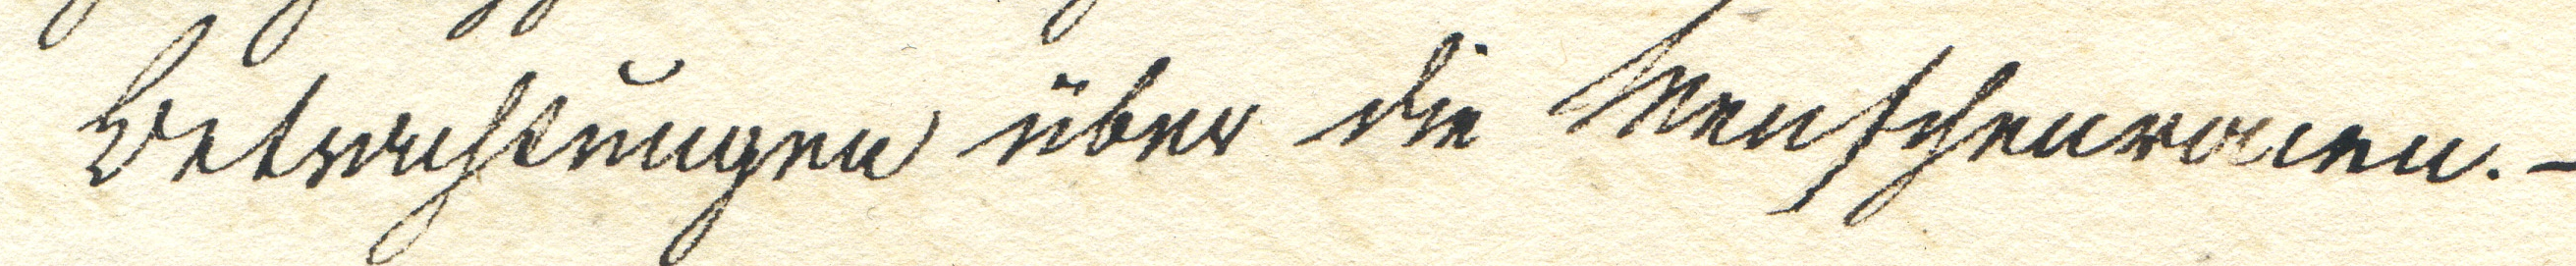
Betrachtungen über die Menschenracen. -
